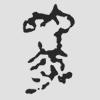{竹骨}
